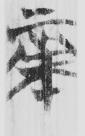帝
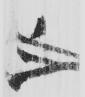之
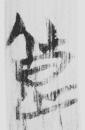良
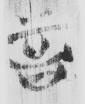言
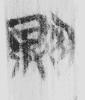則
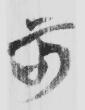可
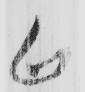㠯（以）
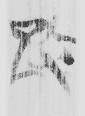改
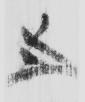之
